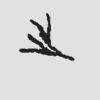出
